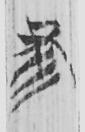𦘔
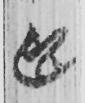臣
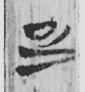疋
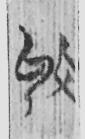收
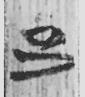疋
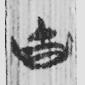由
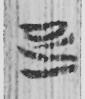疋
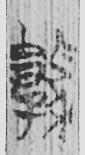{㱿子攴禾}
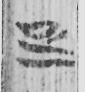疋
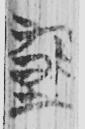{土旬}
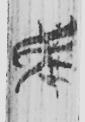民
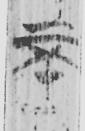不
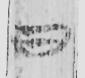日
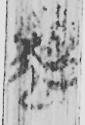幸
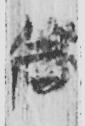尚
